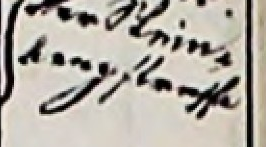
bergstrasse
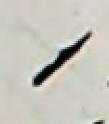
1
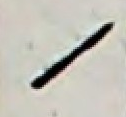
1
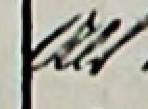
Alt
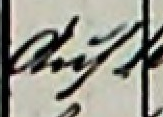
Aus
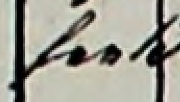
see
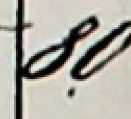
80
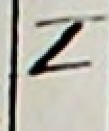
I
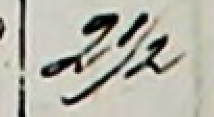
2 1/2
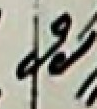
34
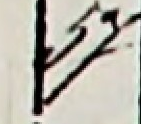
57
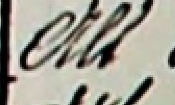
Alt
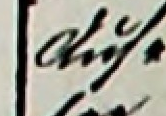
Aus„
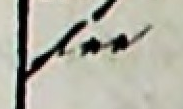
see
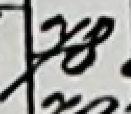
78
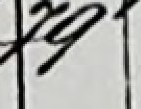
79
